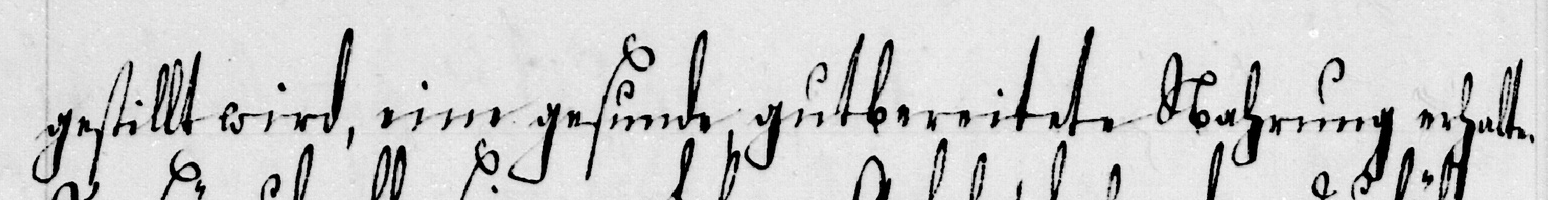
gestillt wird, eine gesunde, gutbereitete Nahrung erhal¬
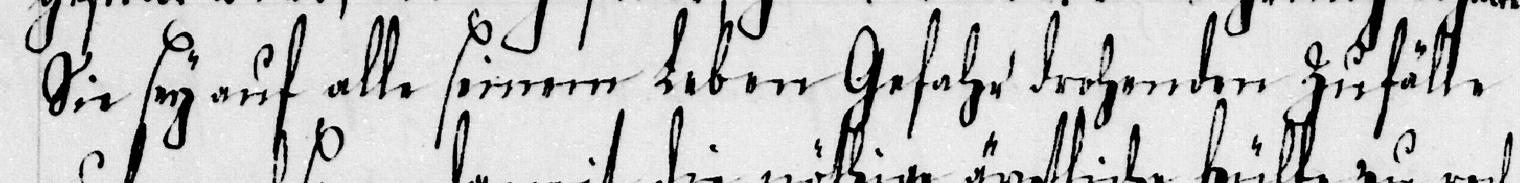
Sie sey auf alle seinem Leben Gefahr drohende Zufälle
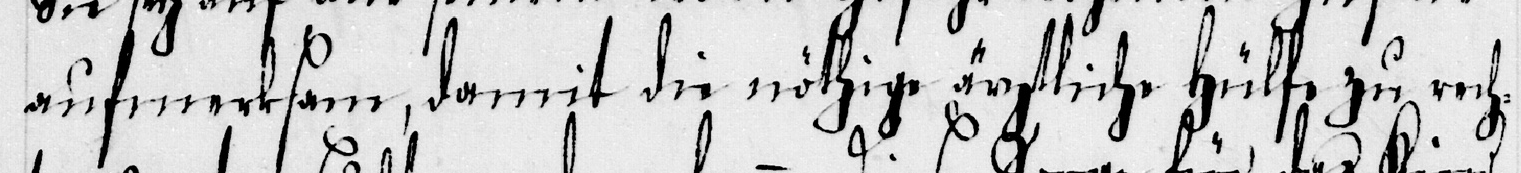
aufmerksam, damit die nöthige ärztliche Hülfe zu rech¬
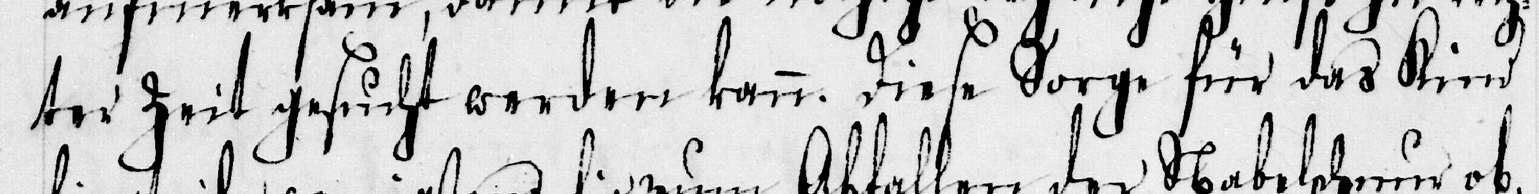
ter Zeit gesucht werden kann. Diese Sorge für das Kind
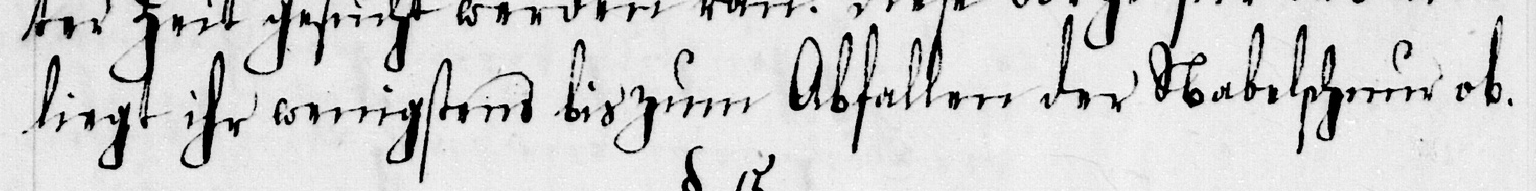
liegt ihr wenigstens bis zum Abfallen der Nabelschnur ob.
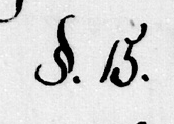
§. 15.
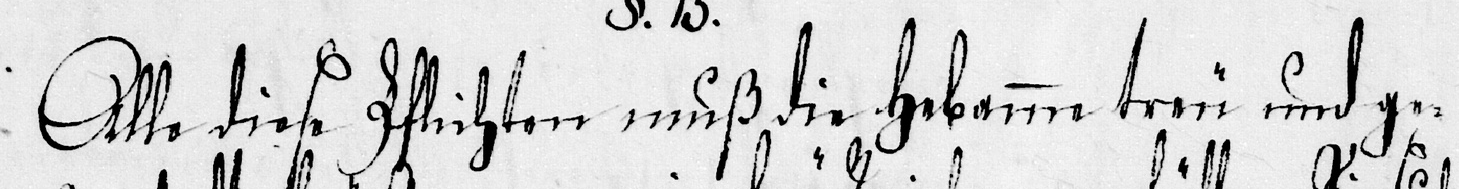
Alle diese Pflichten muß die Hebamme treu und ge¬
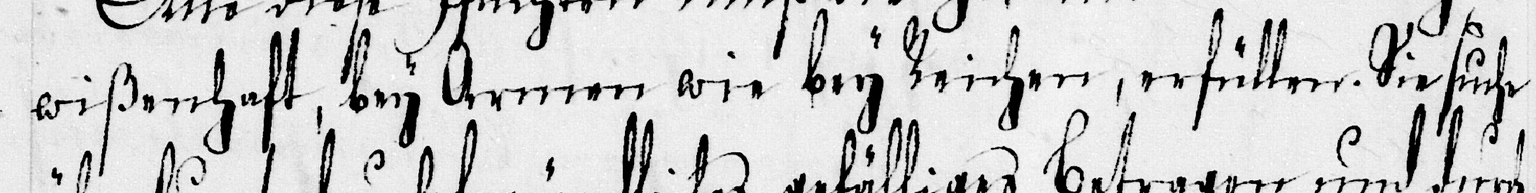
wißenhaft, bey Armen wie bey Reichen, erfüllen. Sie suc¬
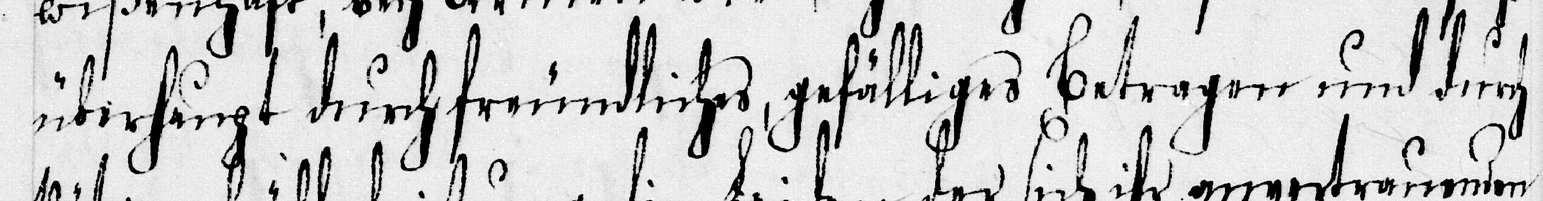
überhaupt durch freundliches, gefälliges Betragen und durch
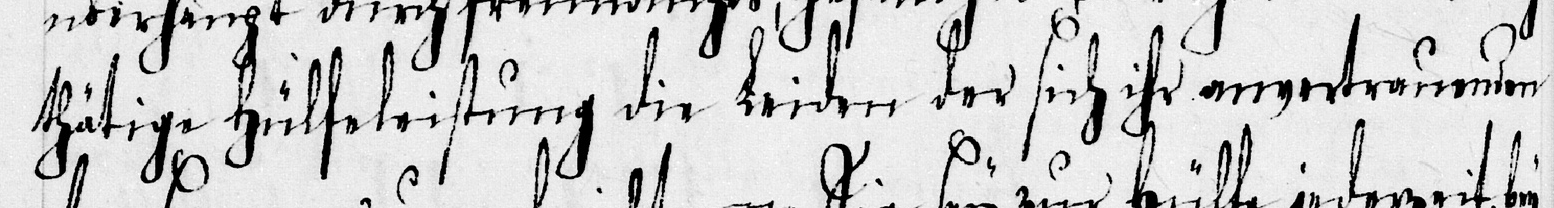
thätige Hülfeleistung die Leiden der sich ihr anvertrauenden
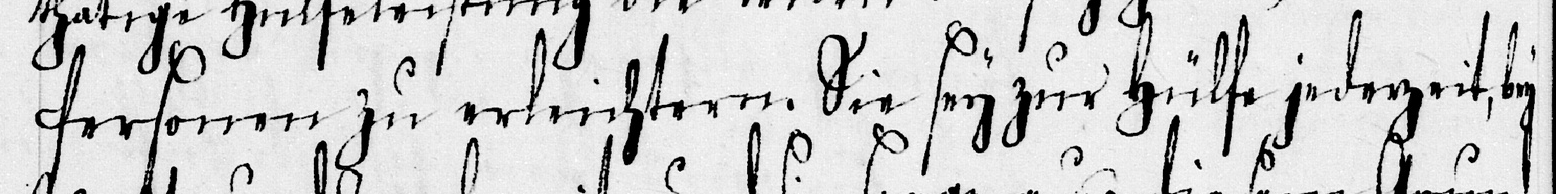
Personen zu erleichtern. Sie sey zur Hülfe jederzeit, b¬
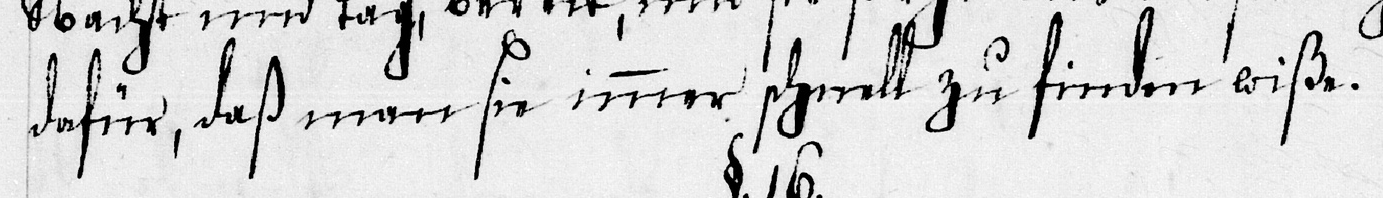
dafür, daß man sie immer schnell zu finden wiße.
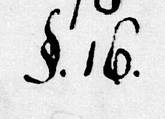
§. 16.
